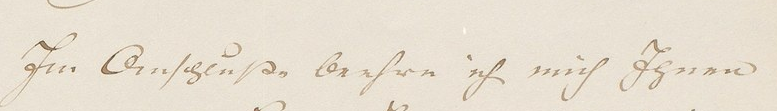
Im Anschluße beehre ich mich Ihnen
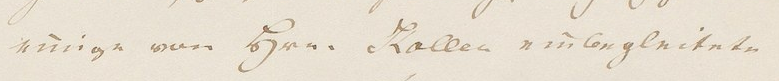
einige von Hrn. Koller einbegleitete
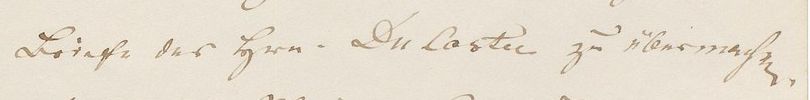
Briefe des Hrn. Du Coster zu übermachen.
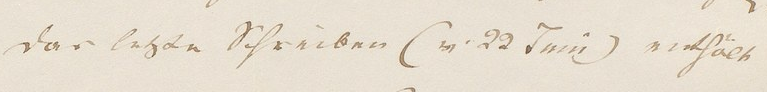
Das letzte Schreiben (v. 22. Juni) enthält
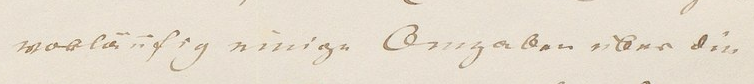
vorläufig einige Angaben über die
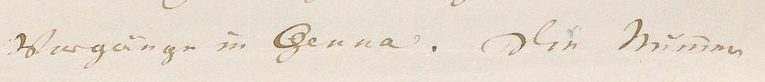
Vorgänge in Genua. Die Nummer
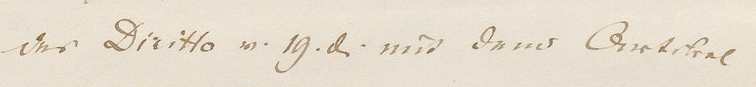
des Diritto v. 19. d. mit dem Artikel
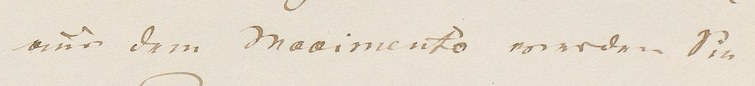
aus dem Movimento werden Sie
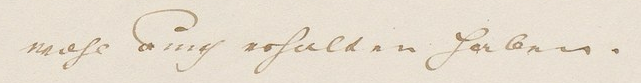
wohl auch erhalten haben.
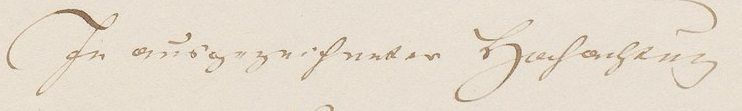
In ausgezeichneter Hochachtung
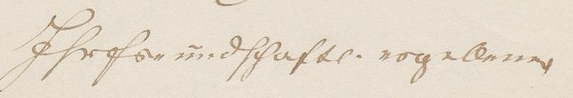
Ihr freundschaftl. ergebener
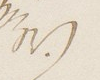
1867.
